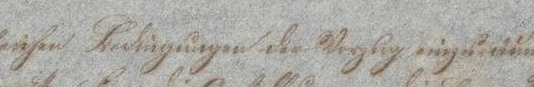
gleichen Bedingungen der Vorzug einzuräumen.
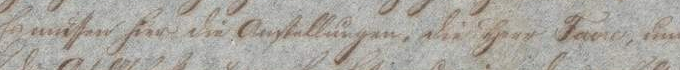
Es müssen hier die Anstellungen, die Herr Favre, und
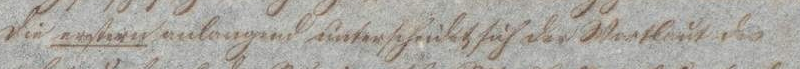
Die erstern anlangend unterscheidet sich der Wortlaut des
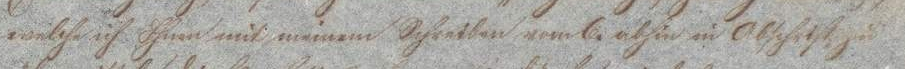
welche ich Ihnen mit meinem Schreiben vom 6. abhin in Abschrift zu
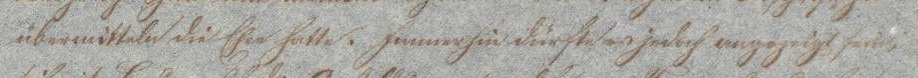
übermitteln die Ehre hatte. Immerhin dürfte es jedoch angezeigt sein,
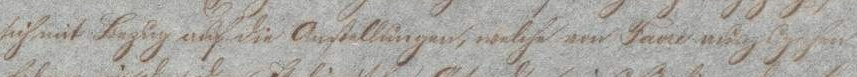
sich mit Bezug auf die Anstellungen, welche von Favre auszugehen
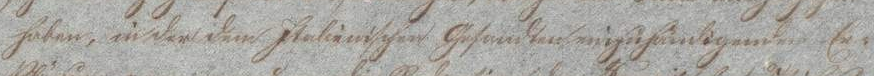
haben, in der dem Italienischen Gesandten einzuhändigenden Er-
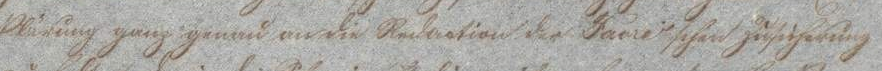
klärung ganz genau an die Redaction der Favre'schen Zusicherung
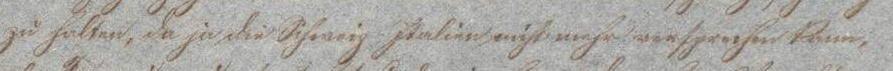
zu halten, da ja die Schweiz Italien nicht mehr versprechen kann,
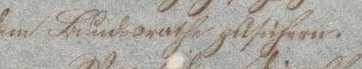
dem Bundesrathe zusichern.
